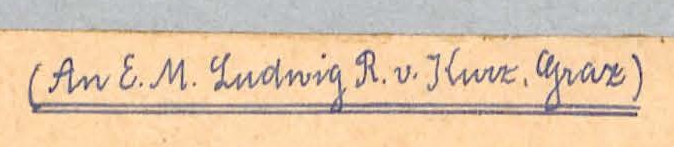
(An E. M. Ludwig R. v. Kurz, Graz)
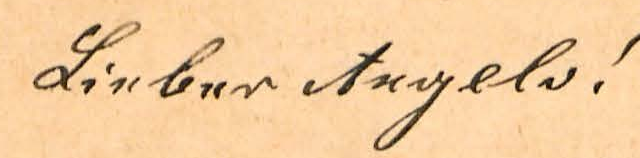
Lieber Angelo!
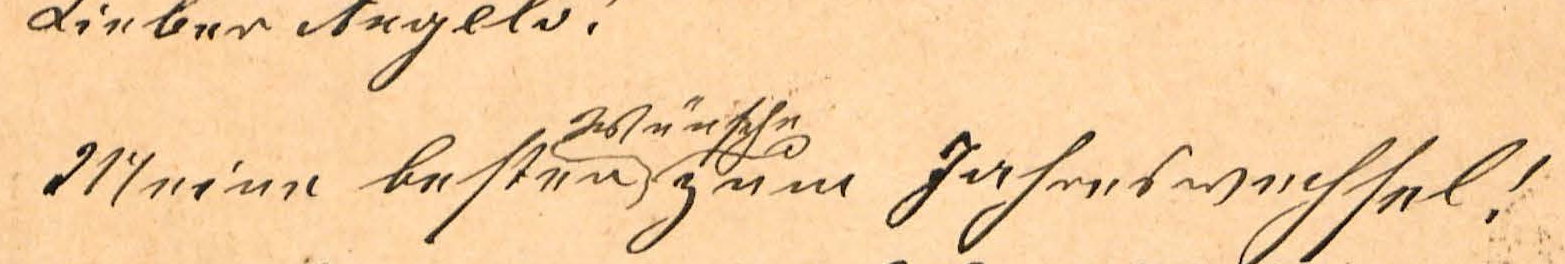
Meine besten Wünsche zum Jahreswechsel!
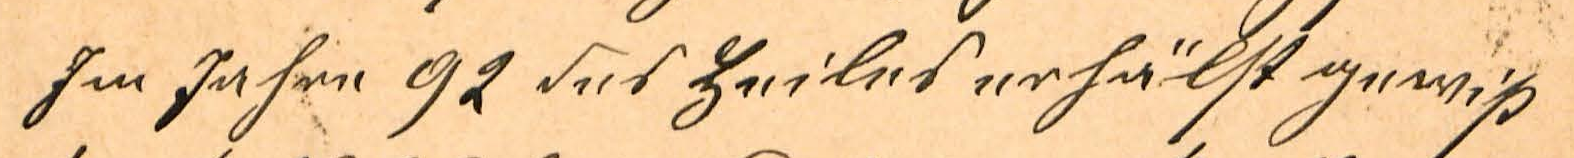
Im Jahr 98 des Heiles erhalst gewiß
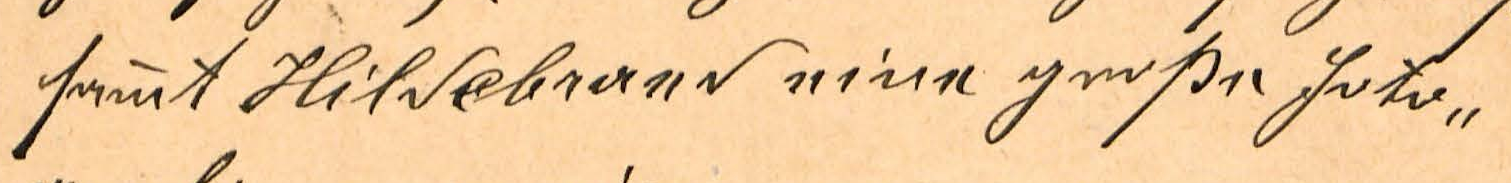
faust Hildebrand eine große Foto-
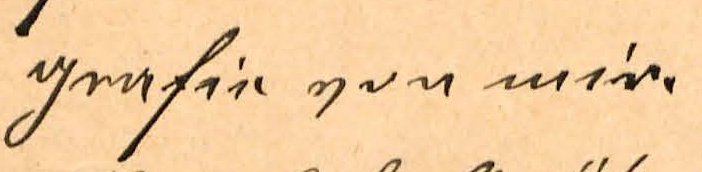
grafie von mir.
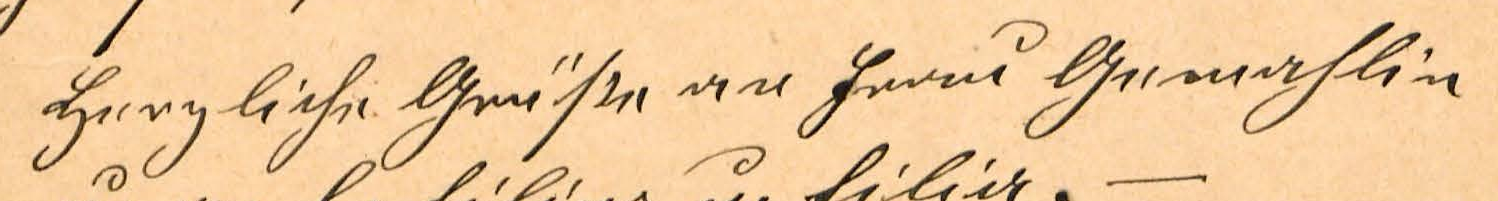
Herzliche Grüße an Frau Gemahlin
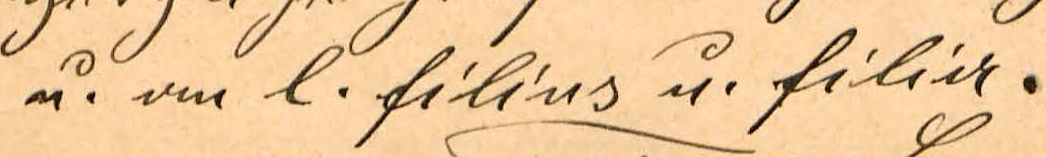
u. an. l. filius u. filia.-
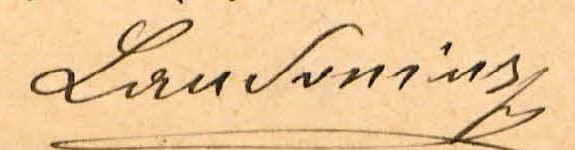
Laudonius
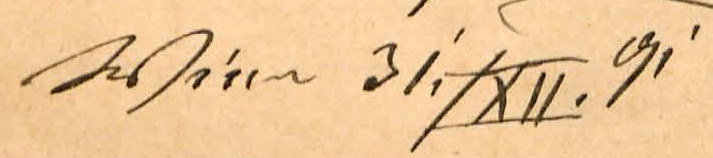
Wien 31. IXII. 91
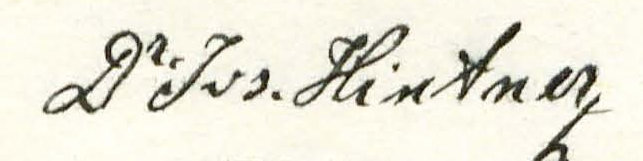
Dr. Jos. Hintner
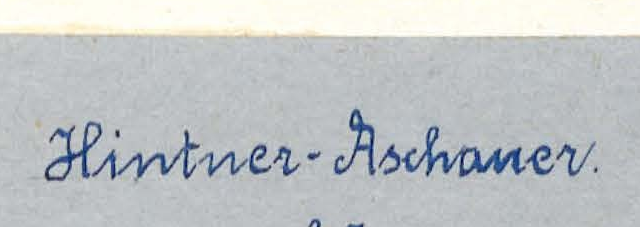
Hintner - Aschauer.
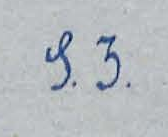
S.3.
